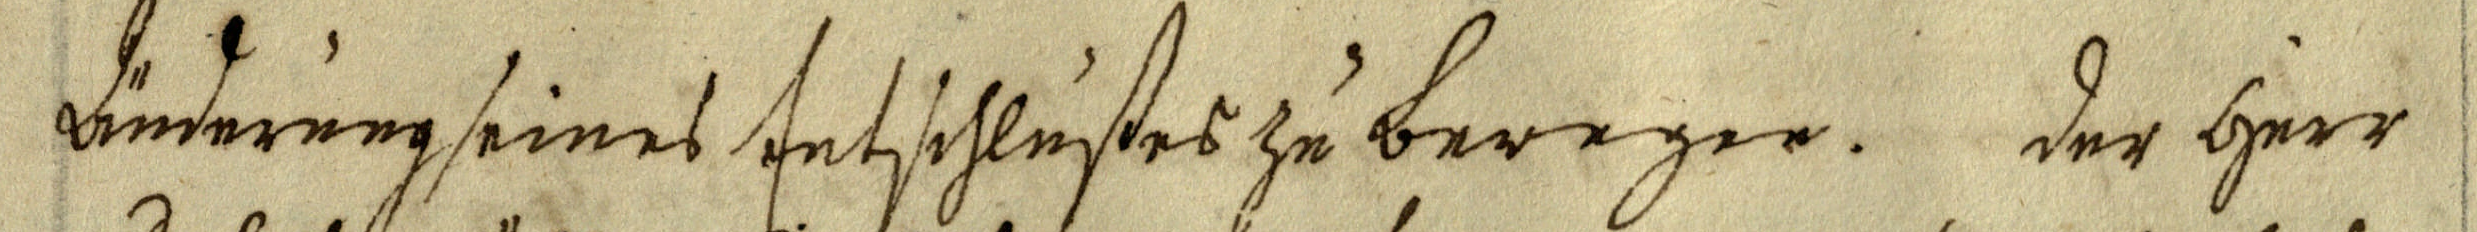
Änderung seines Entschlußes zu bewegen. Der Herr
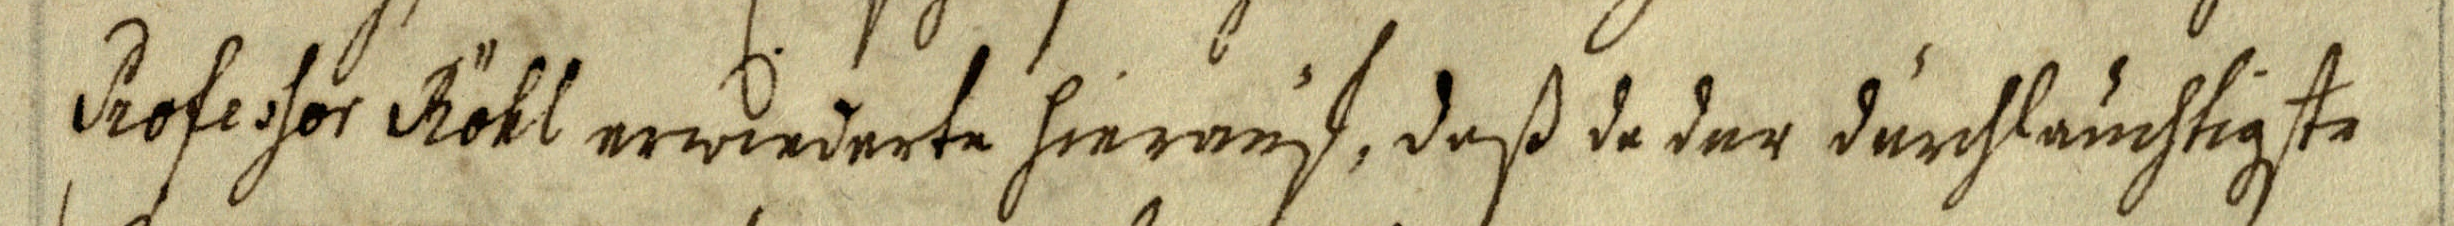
Professor Röhl erwiederte hierauf, daß da der durchlauchtigste
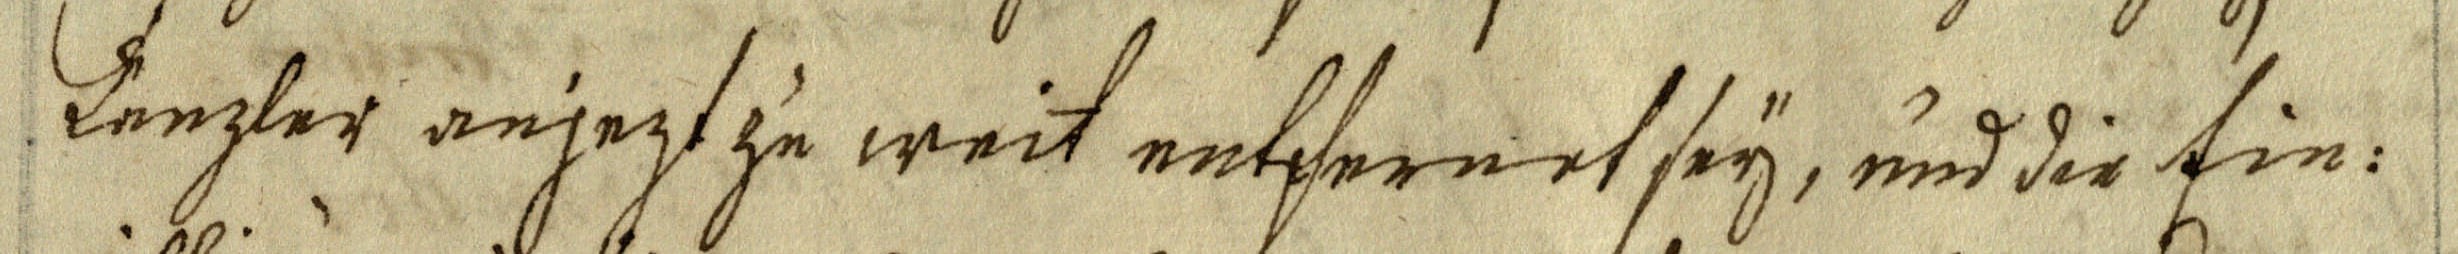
Canzler anjezt weit entfernet seÿ, und die Ein¬
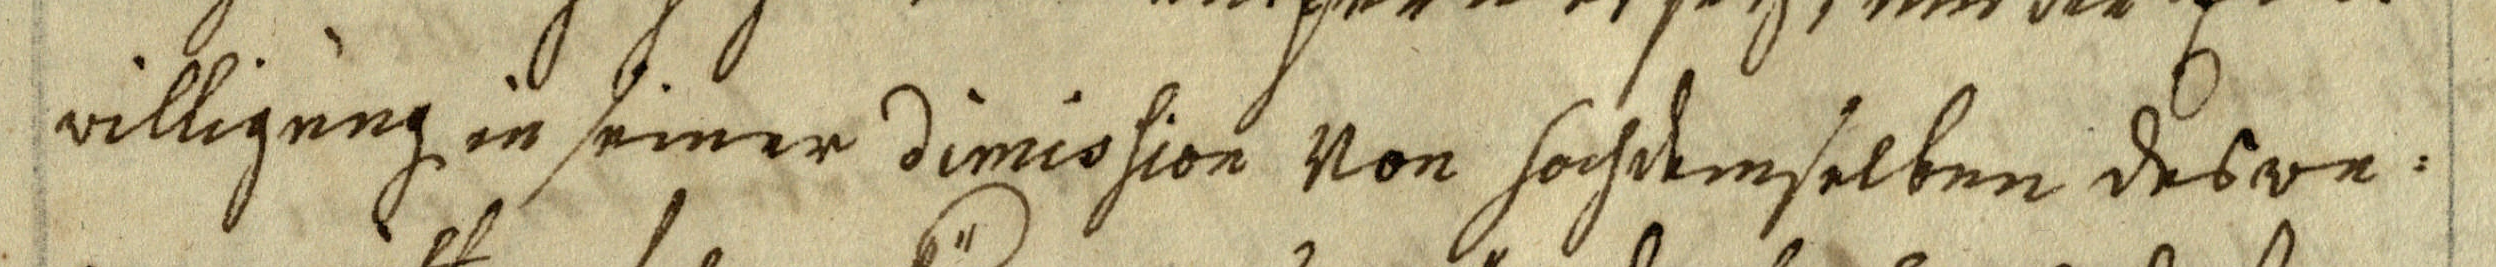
willigung in seiner dimission von hochdemselben deswe¬
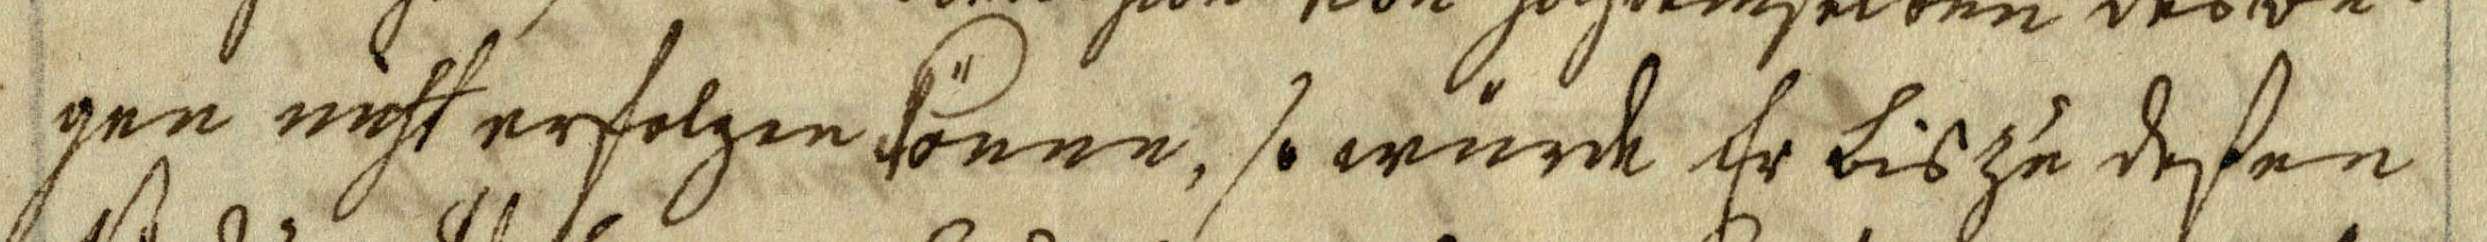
gen nicht erfolgen könne, so würde Er bis zu deßen
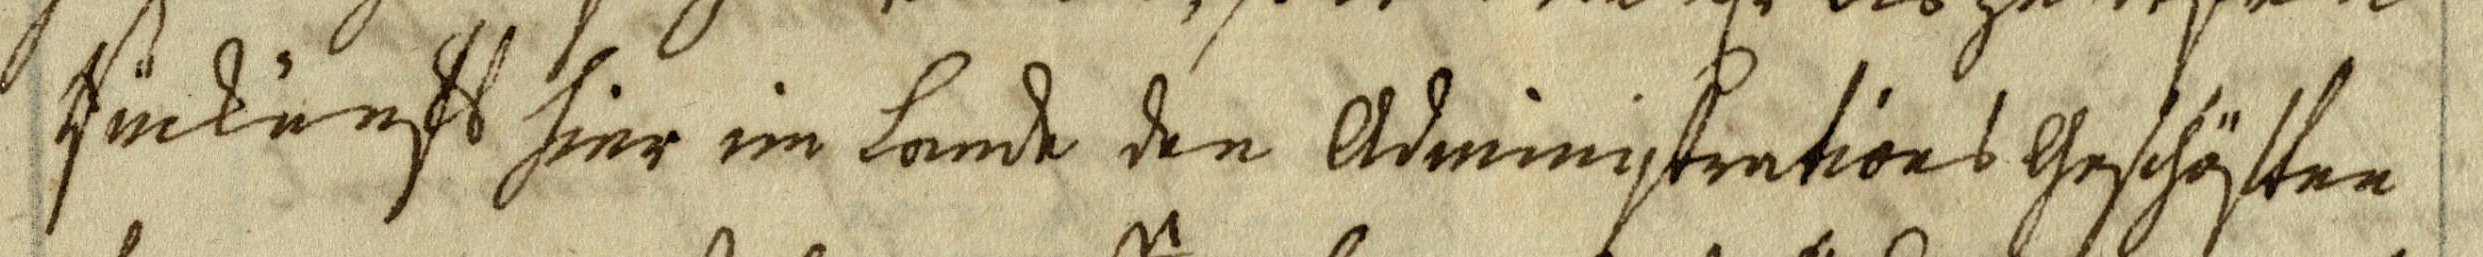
Rückunft hier im Lande den Administrations Geschäften
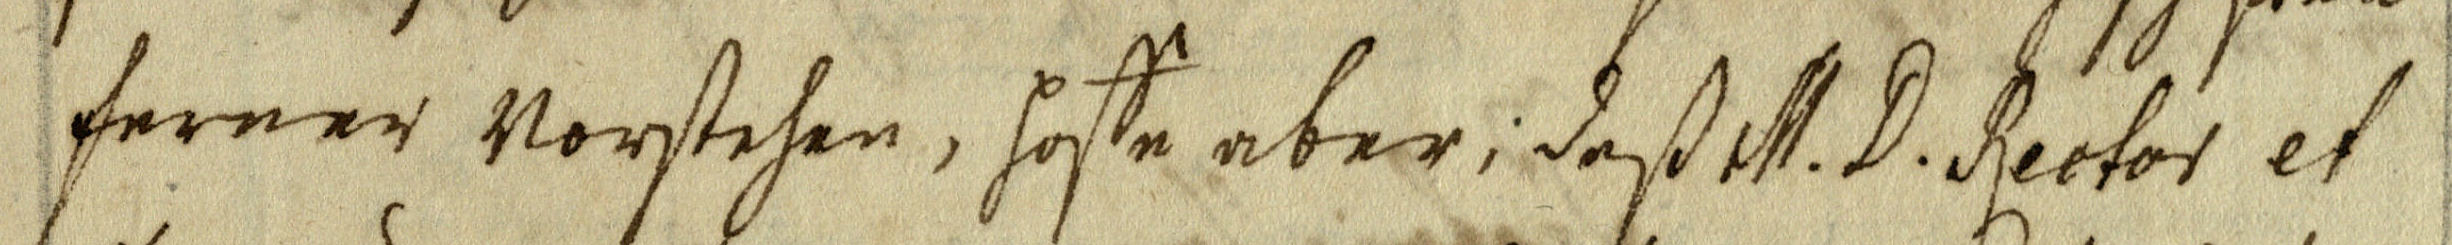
ferner vorstehen, hoffe aber; daß M. D. Rector et
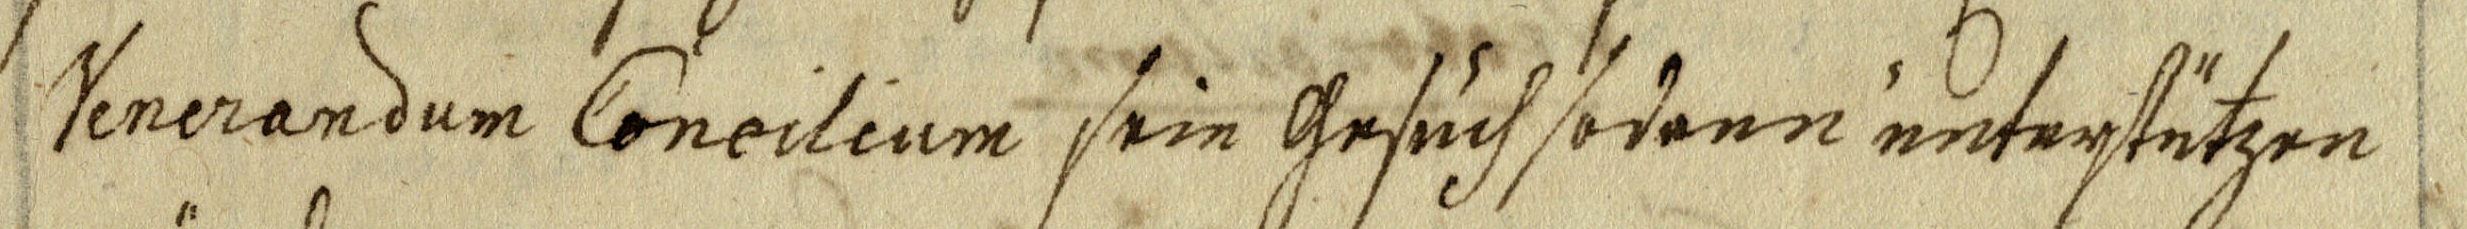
Venerandum Concilium sein Gesuch sodann unterstützen
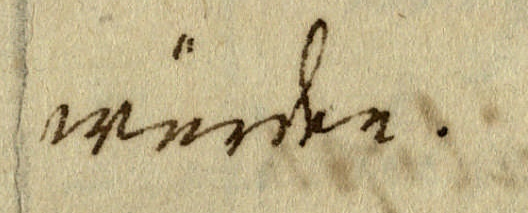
würden.
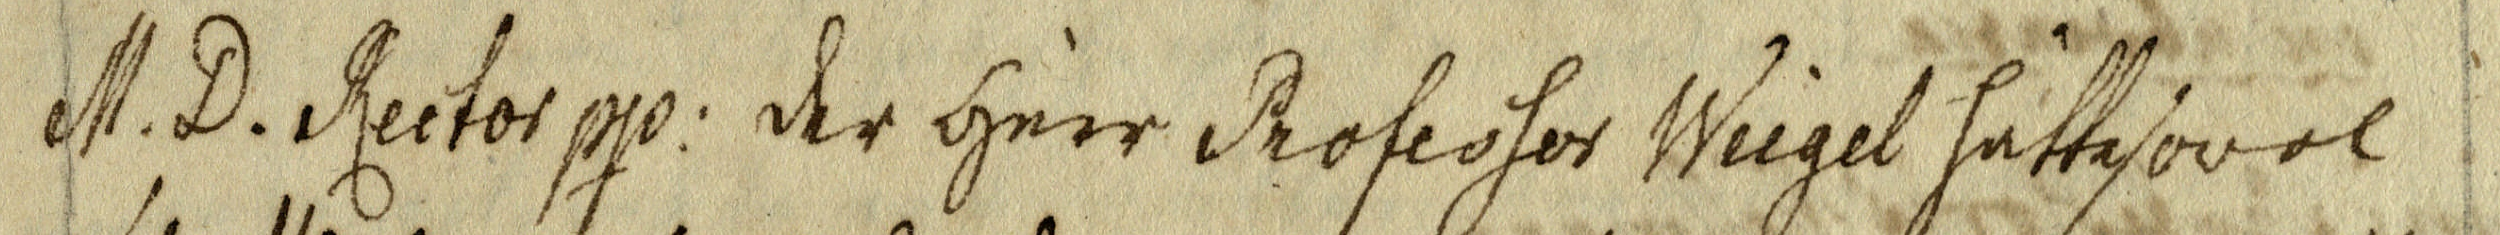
M. D. Rector pp. Der Herr Professor Weigel hätte sowol
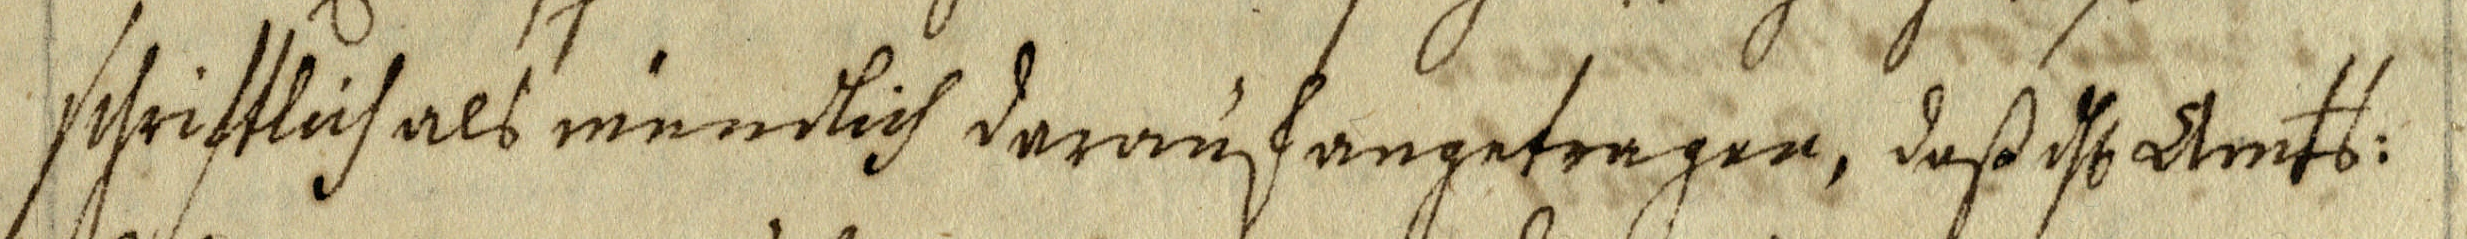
schriftlich als mündlich darauf angetragen, daß dh Amts¬
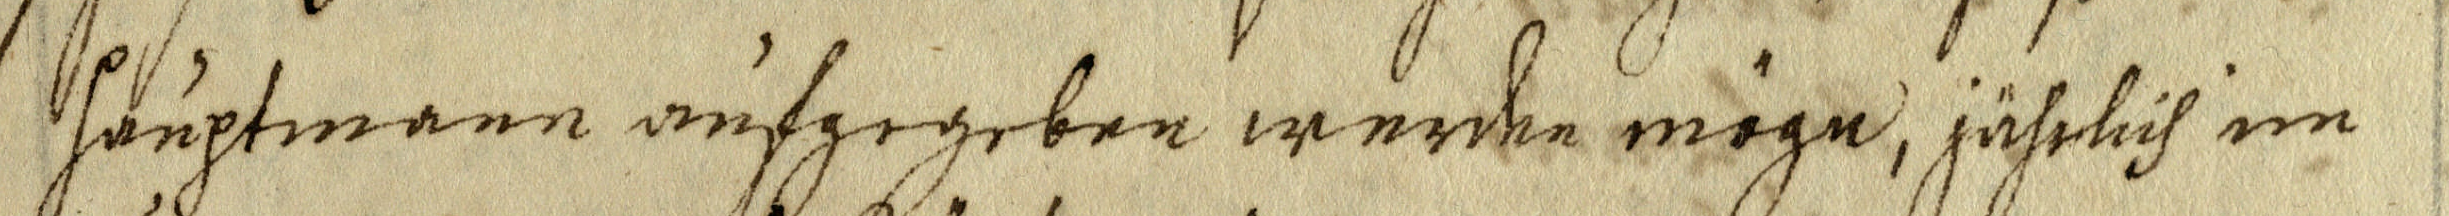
hauptmann aufgegeben werden möge, jährlich im
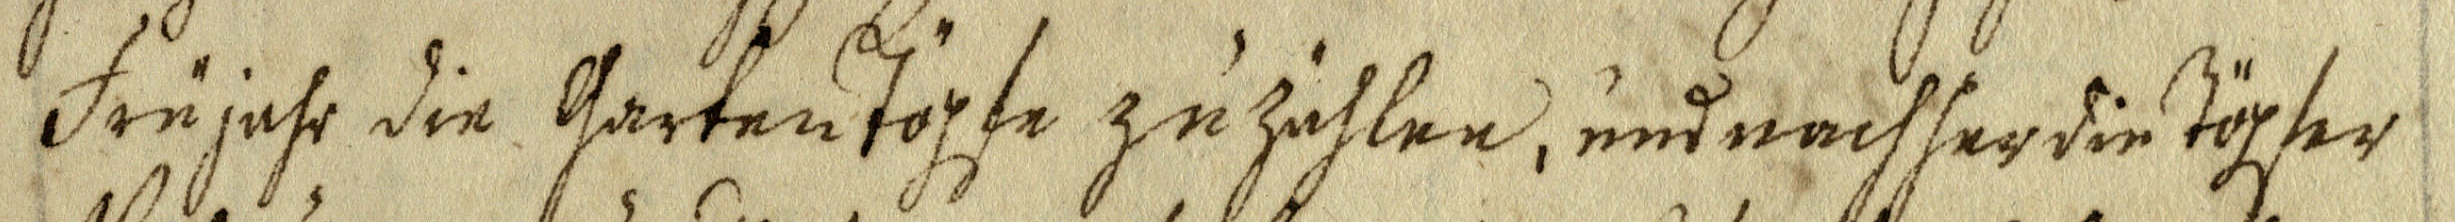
Frühjahr die GartenTöpfe zu zählen, und nachher die Töpfer
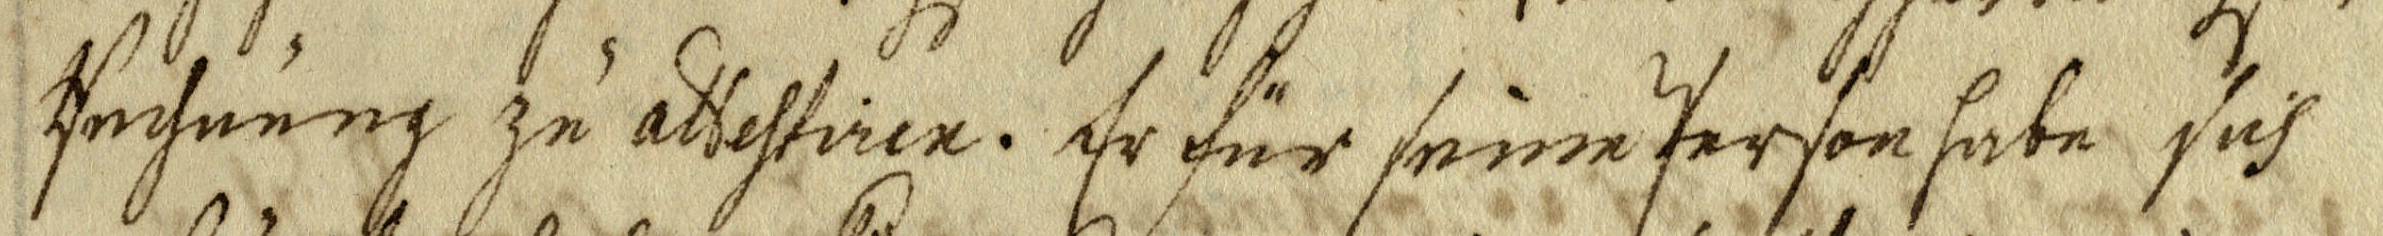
Rechnung zu attestiren. Er für seine Person habe sich
